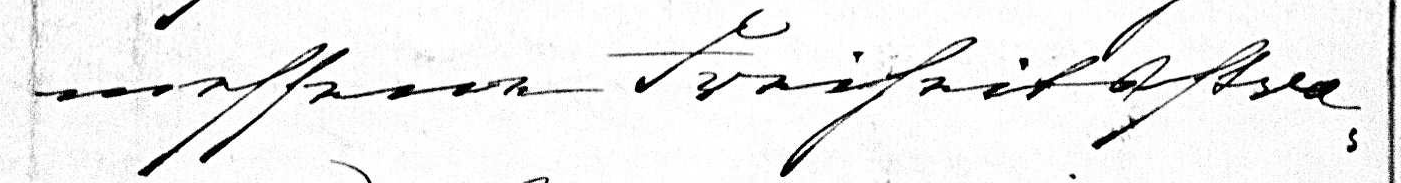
messene Freiheitsstra¬
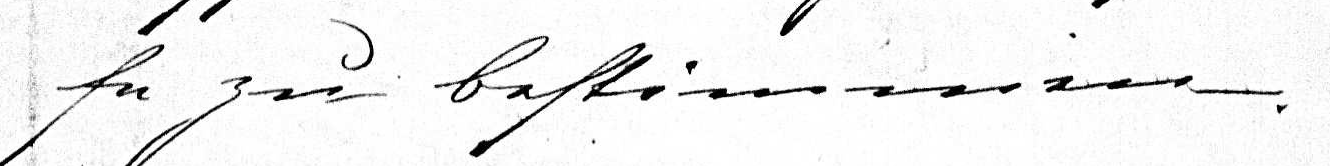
fe zu bestimmen.
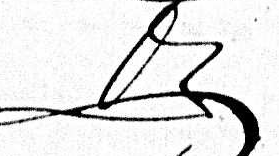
FJ
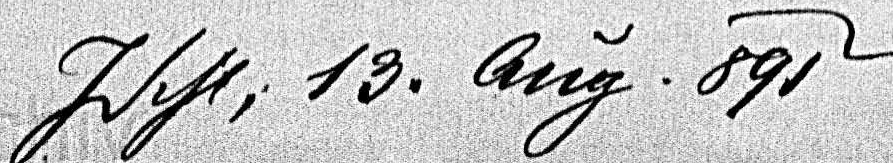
Ischl 13. Aug. 1891
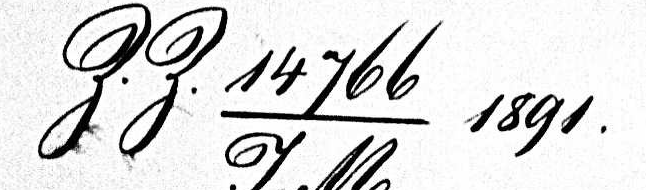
ZZ 14766/ – 1891
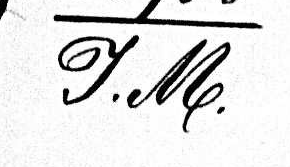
J.M.
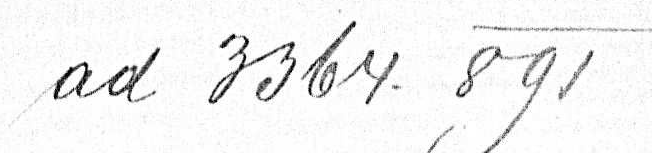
ad 3364 1891
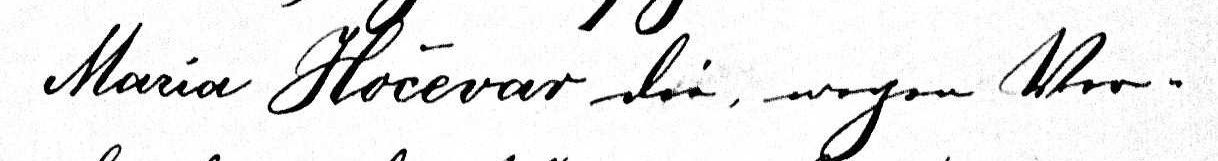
Maria Hočevar die wegen Ver¬
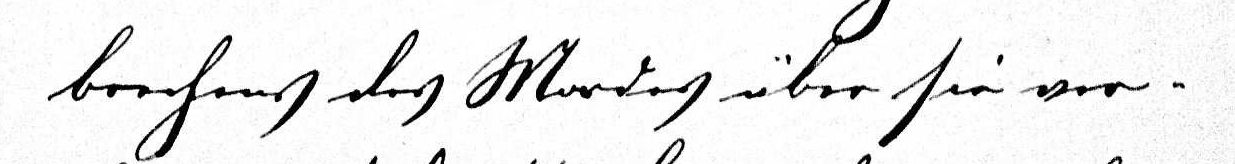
brechens des Mordes über sie ver¬
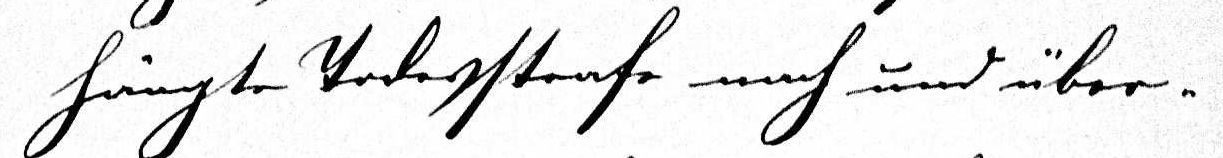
hängte Todesstrafe nach und über¬
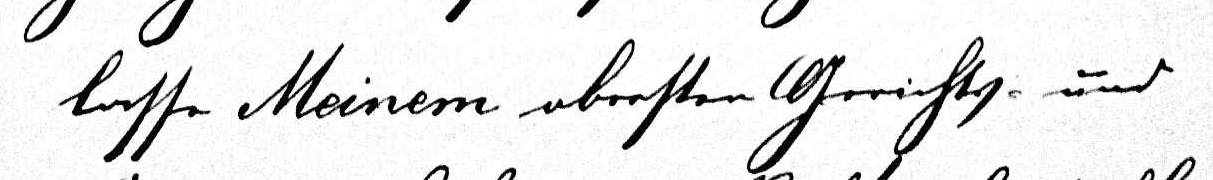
lasse Meinem Obersten Gerichts- und
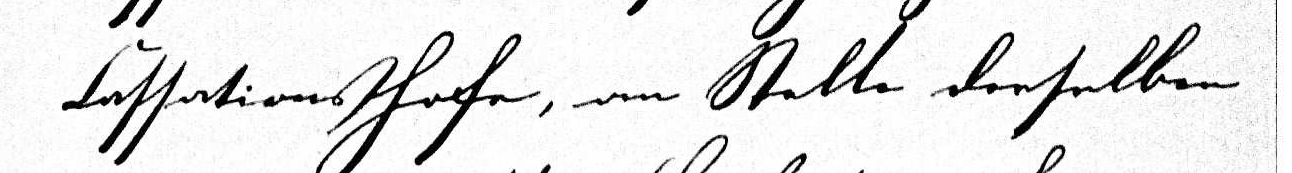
Cassationshofe, an Stelle derselben
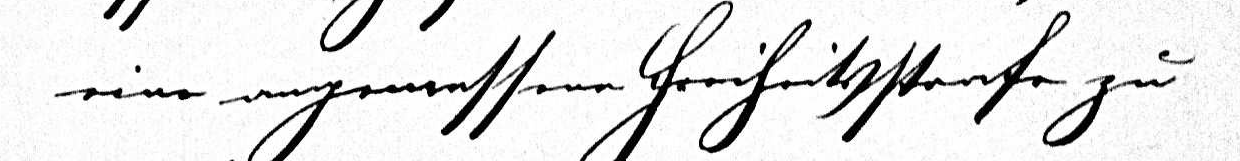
eine angemessene Freiheitsstrafe zu
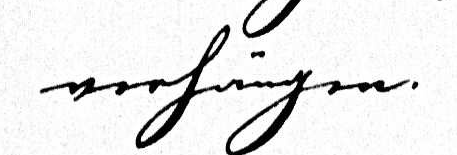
verhängen.
